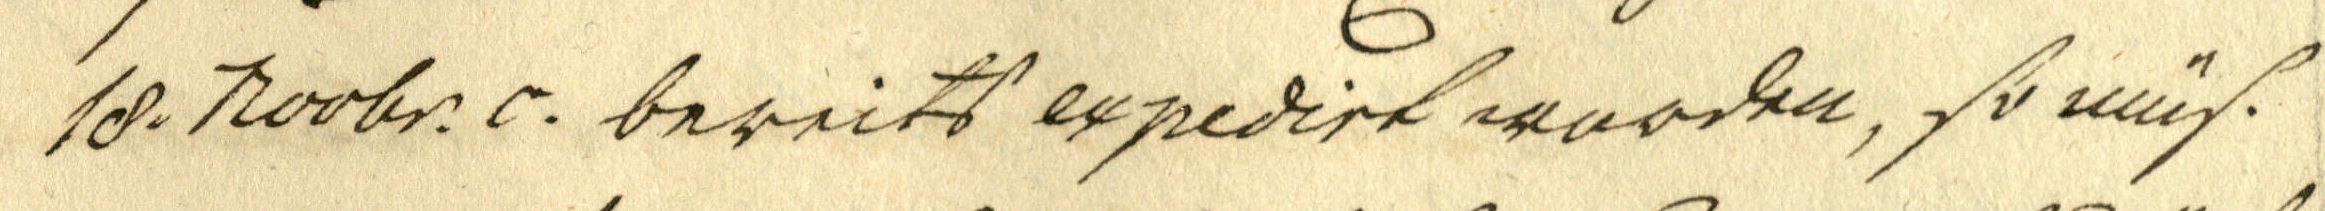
18. Novbr. c. bereits expedirt worden, so müs¬
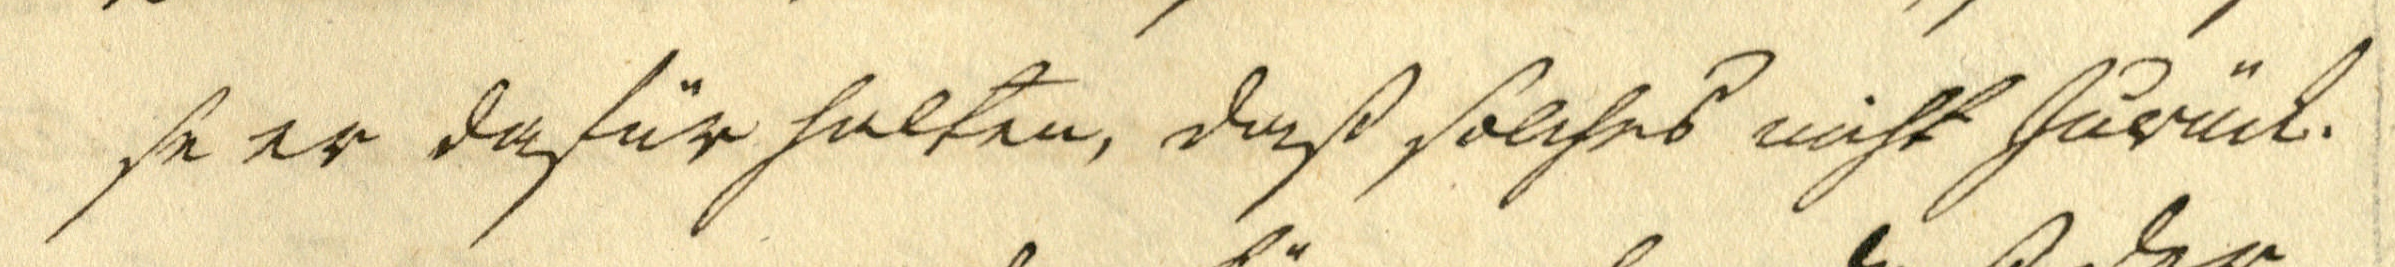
se er dafür halten, daß solches nicht zurück¬
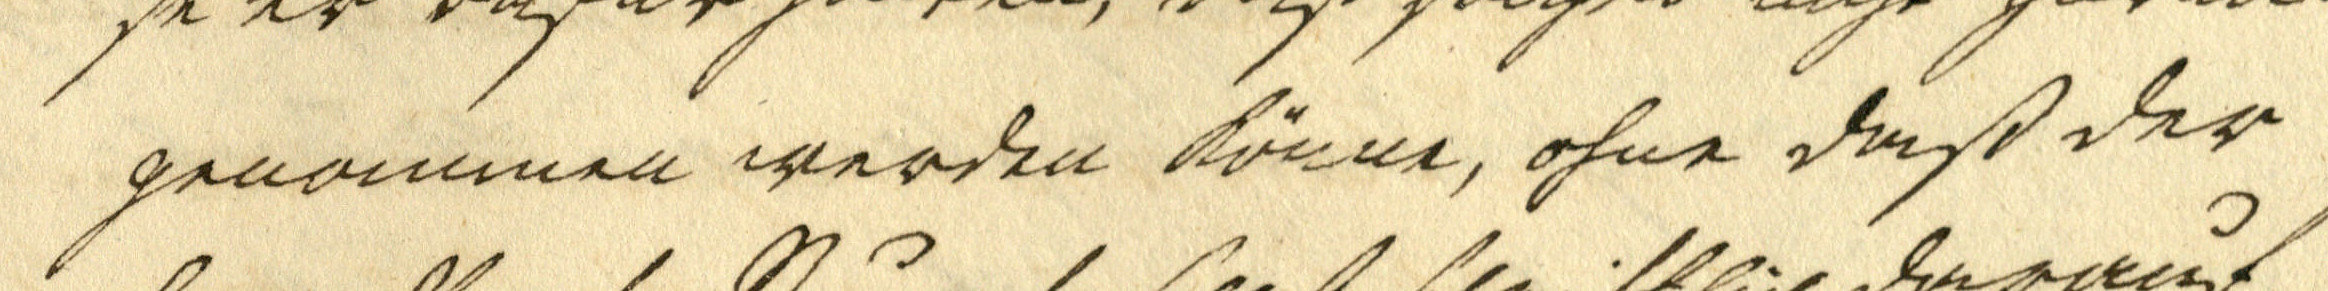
genommen werden könne, ohne daß der
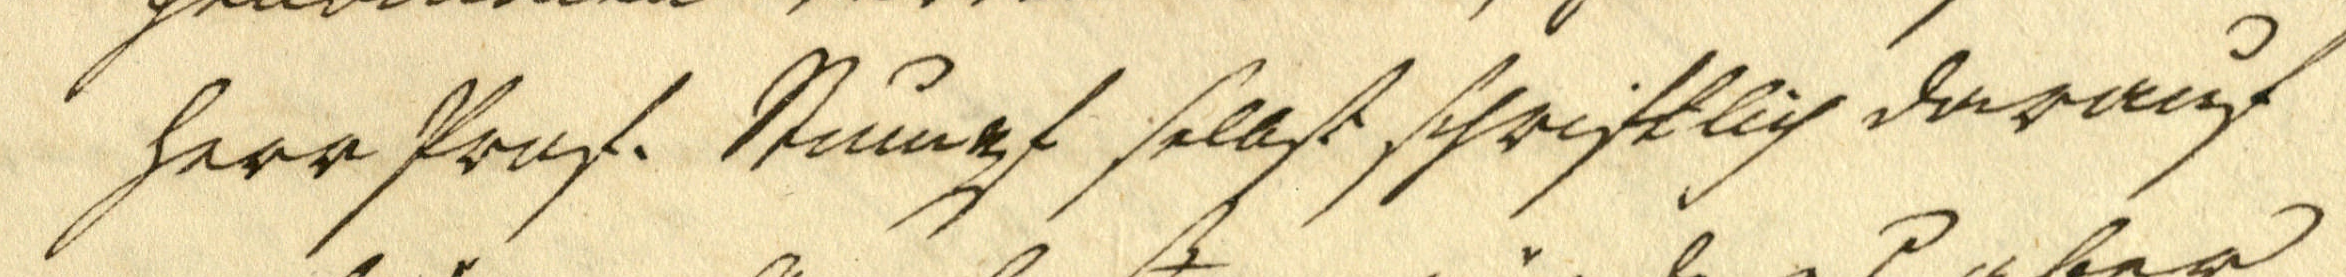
Herr Prof. Stumpf selbst schriftlich darauf
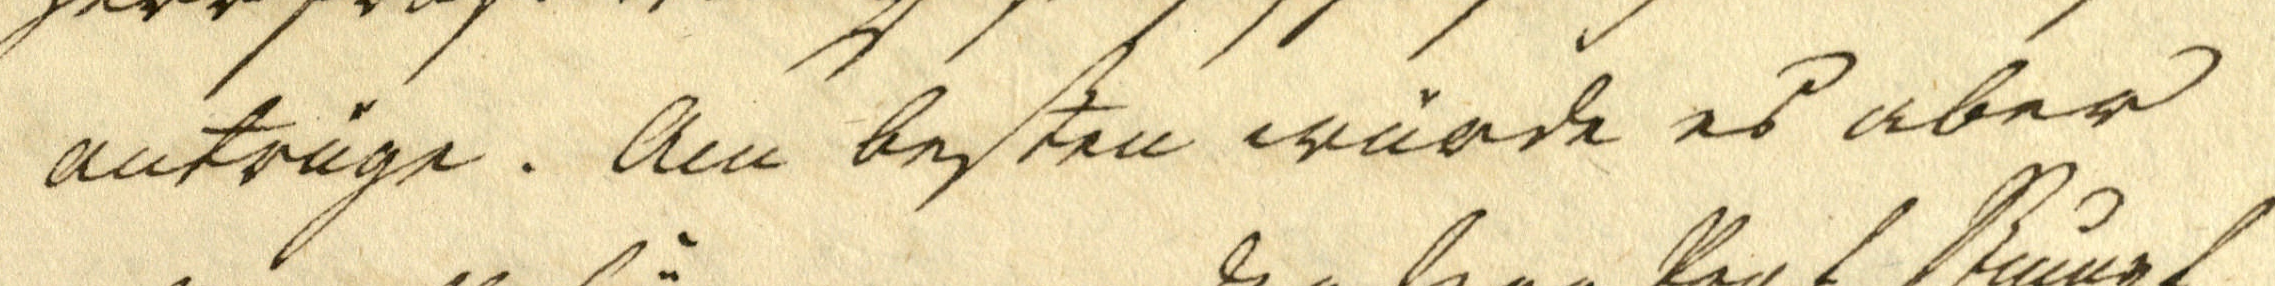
anträge. Am besten würde es aber
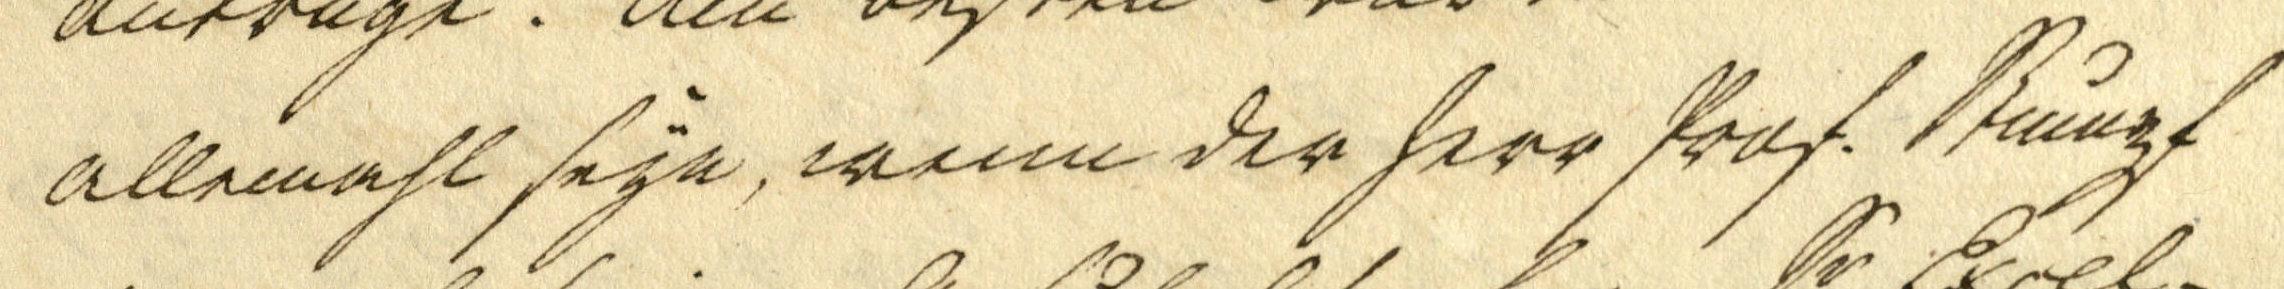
allemahl seÿn, wenn der Herr Prof. Stumpf
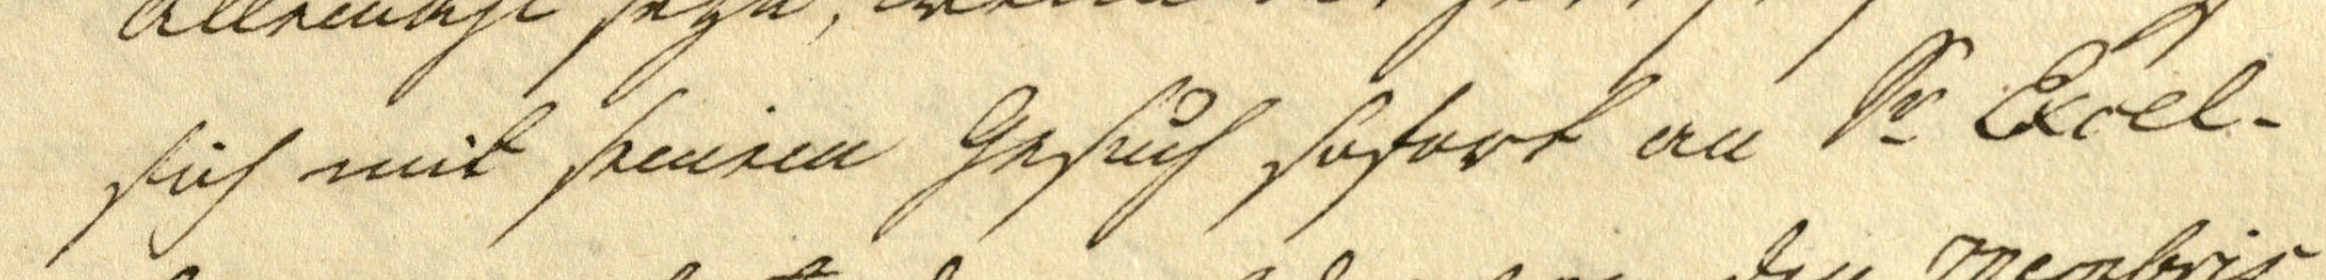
sich mit seinem Gesuch sofort an Sr Excel¬
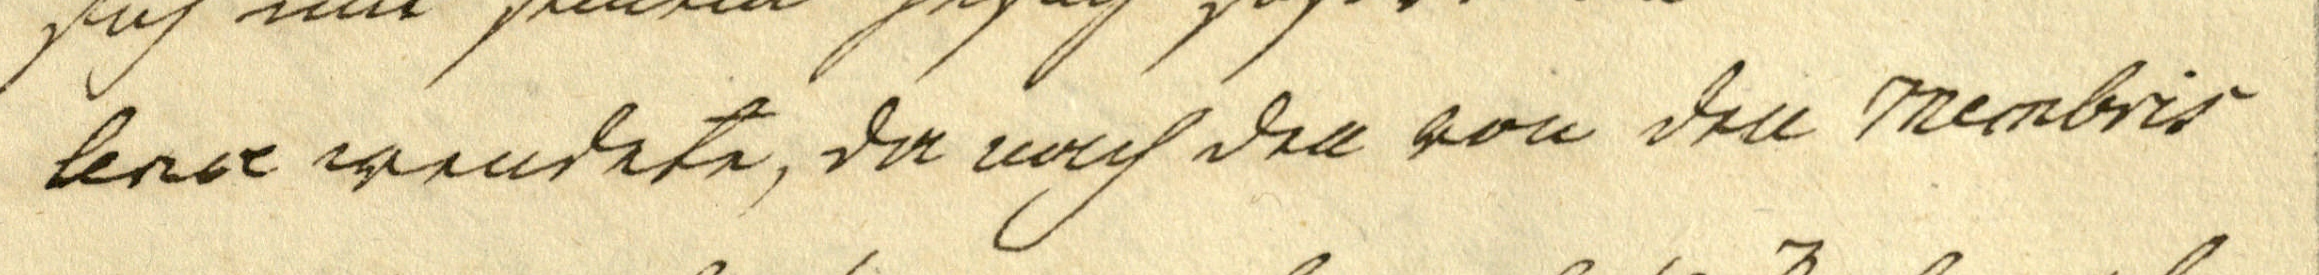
lence wendete, da nach den von den Membris
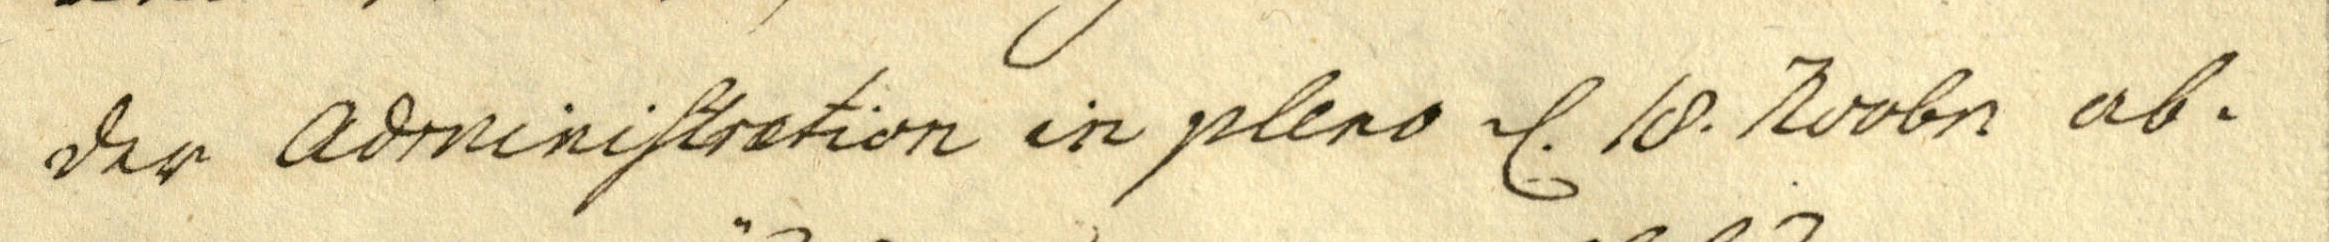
der Administration in pleno d. 18. Novbr ab¬
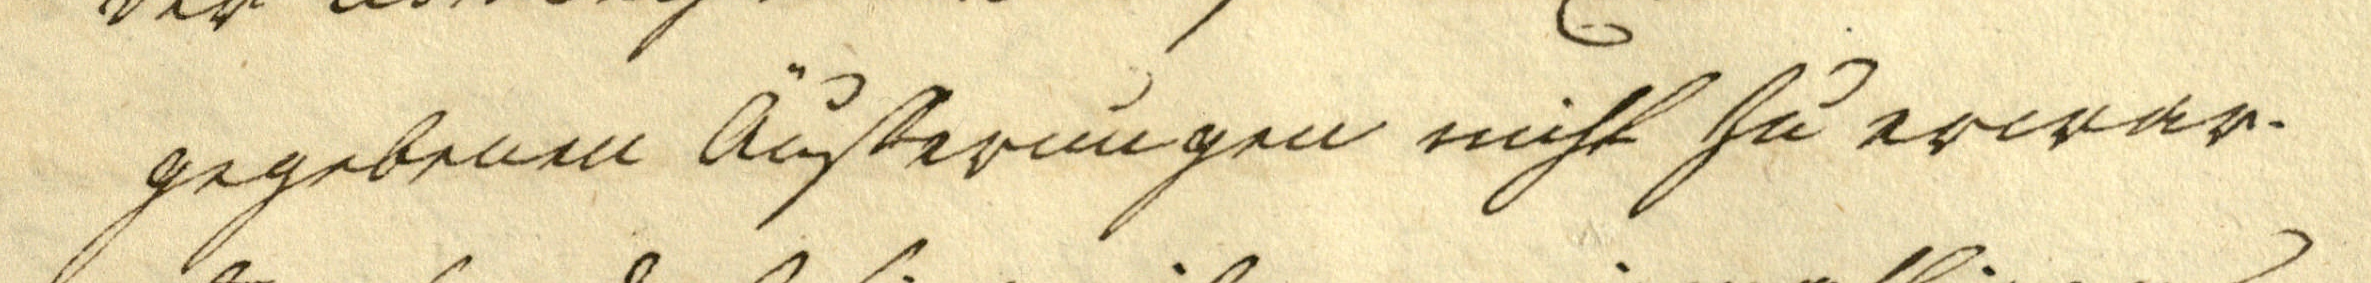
gegebenen Äusserungen nicht zu erwar-
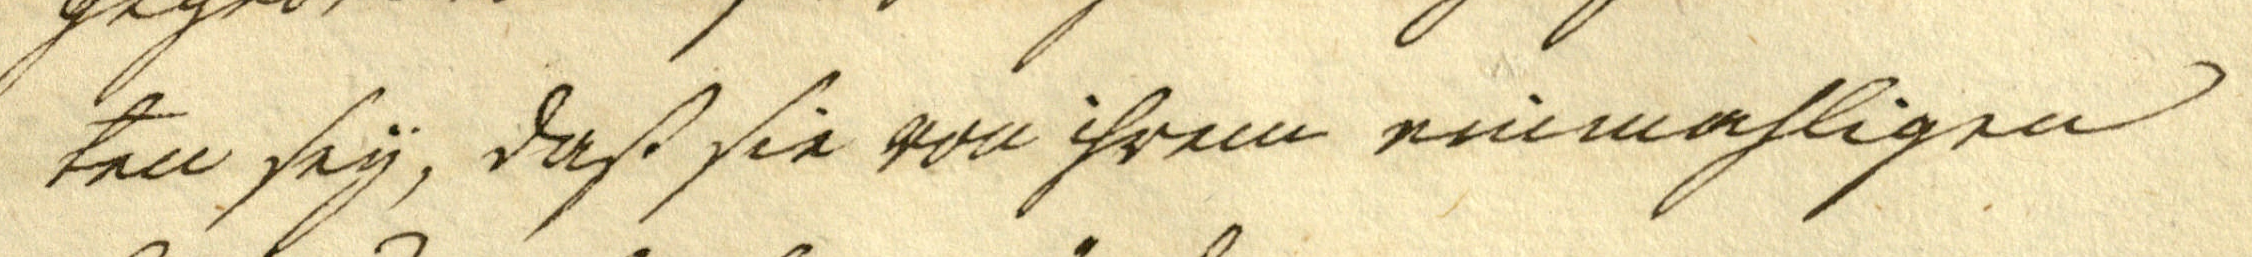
ten seÿ, daß sie von ihrem einmahligen
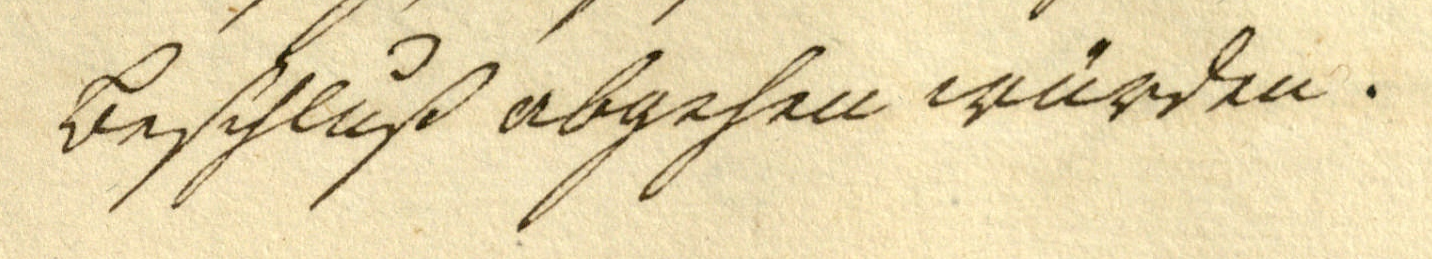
Beschluß abgehen würden.
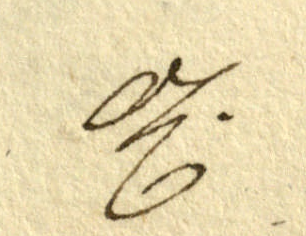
dh.
